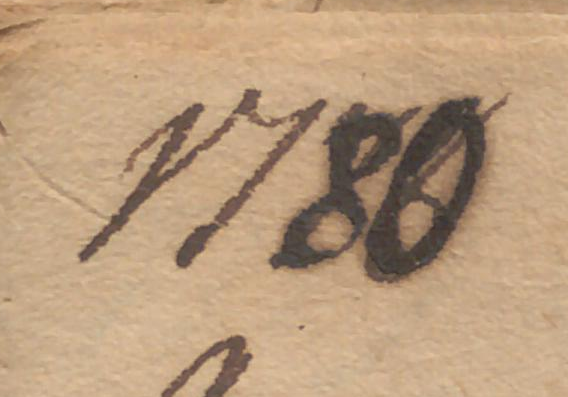1780
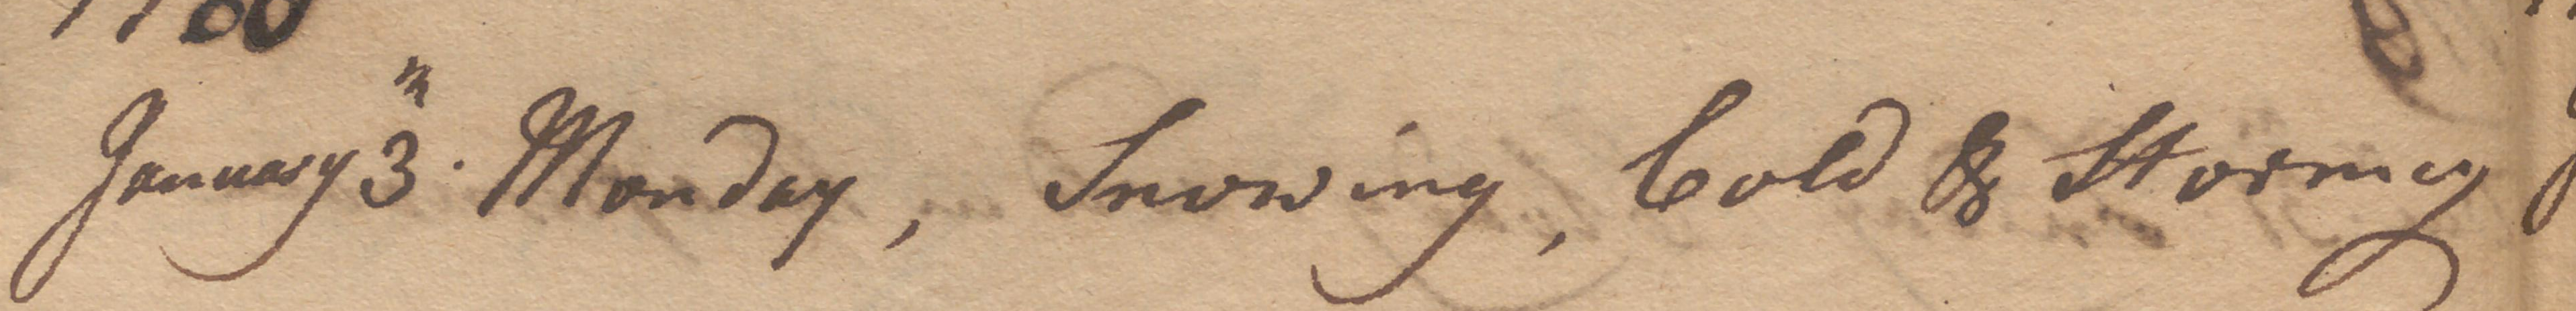January 3^th. Monday, Snowing, Cold & Stormey
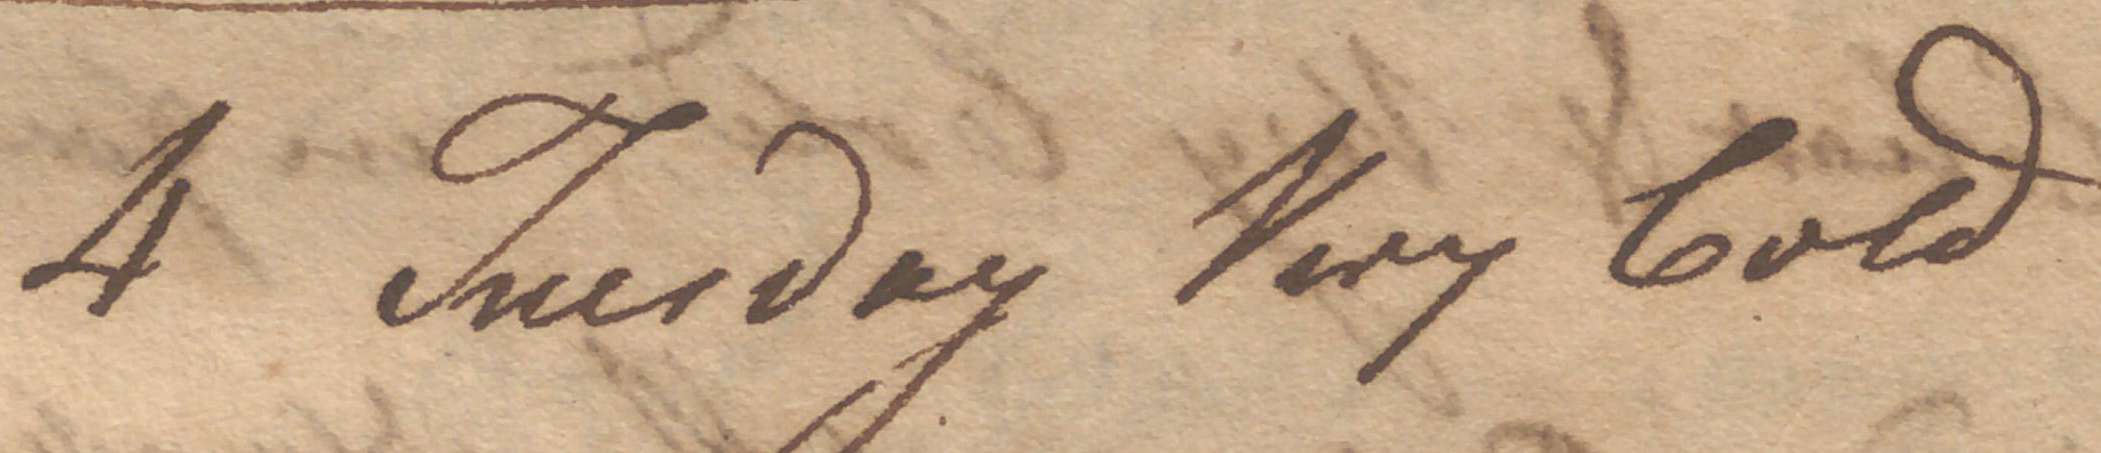4 Tuesday Very Cold
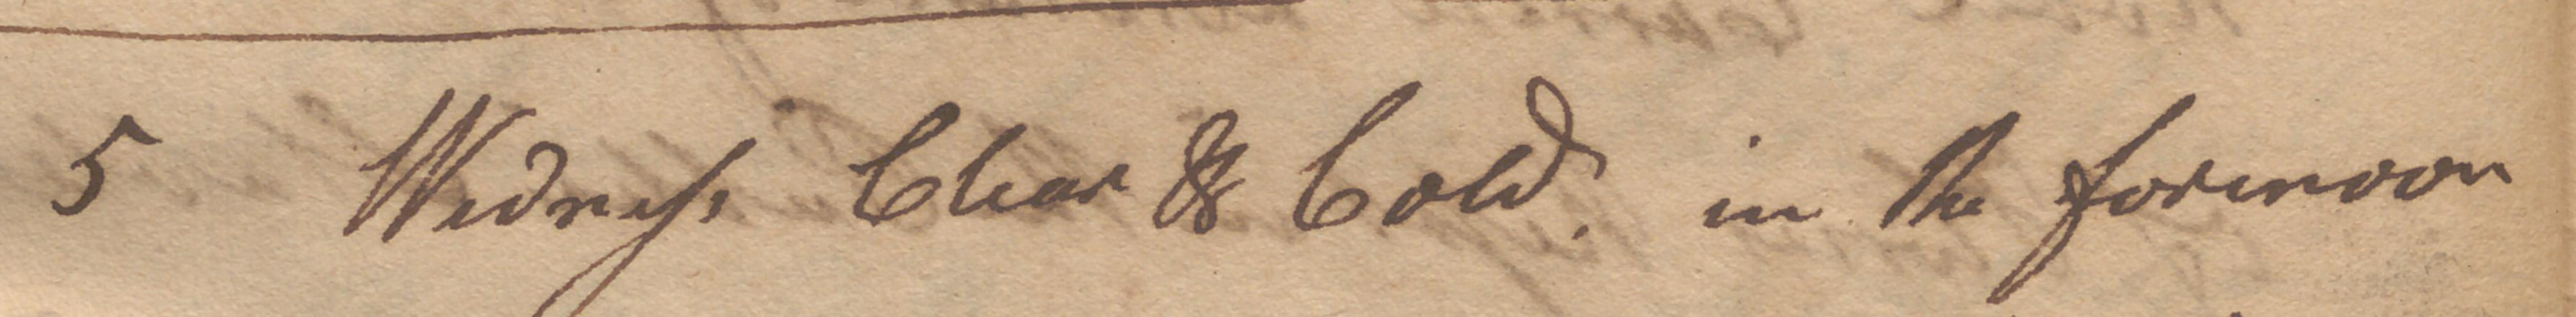5 Wedness Clear & Cold. in the forenoon
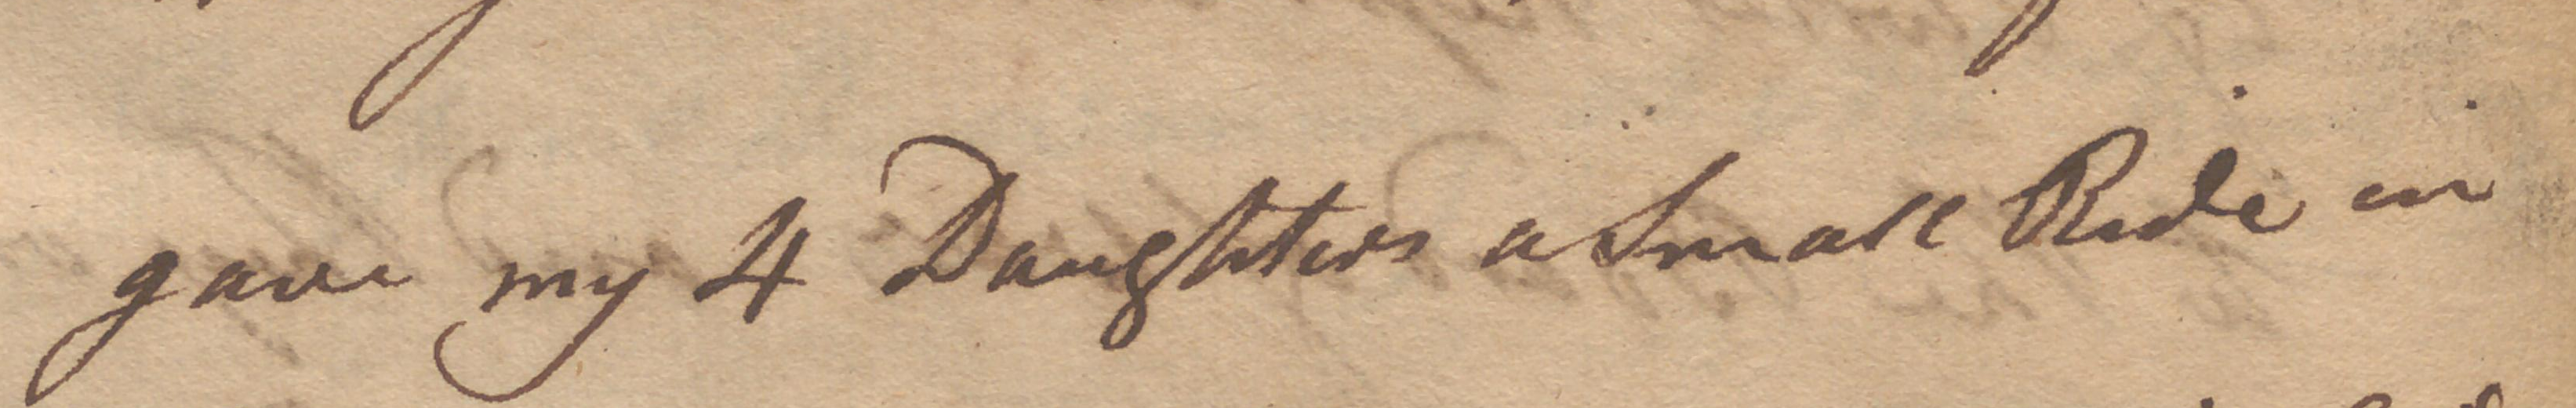gave my 4 Daughters a small Ride in
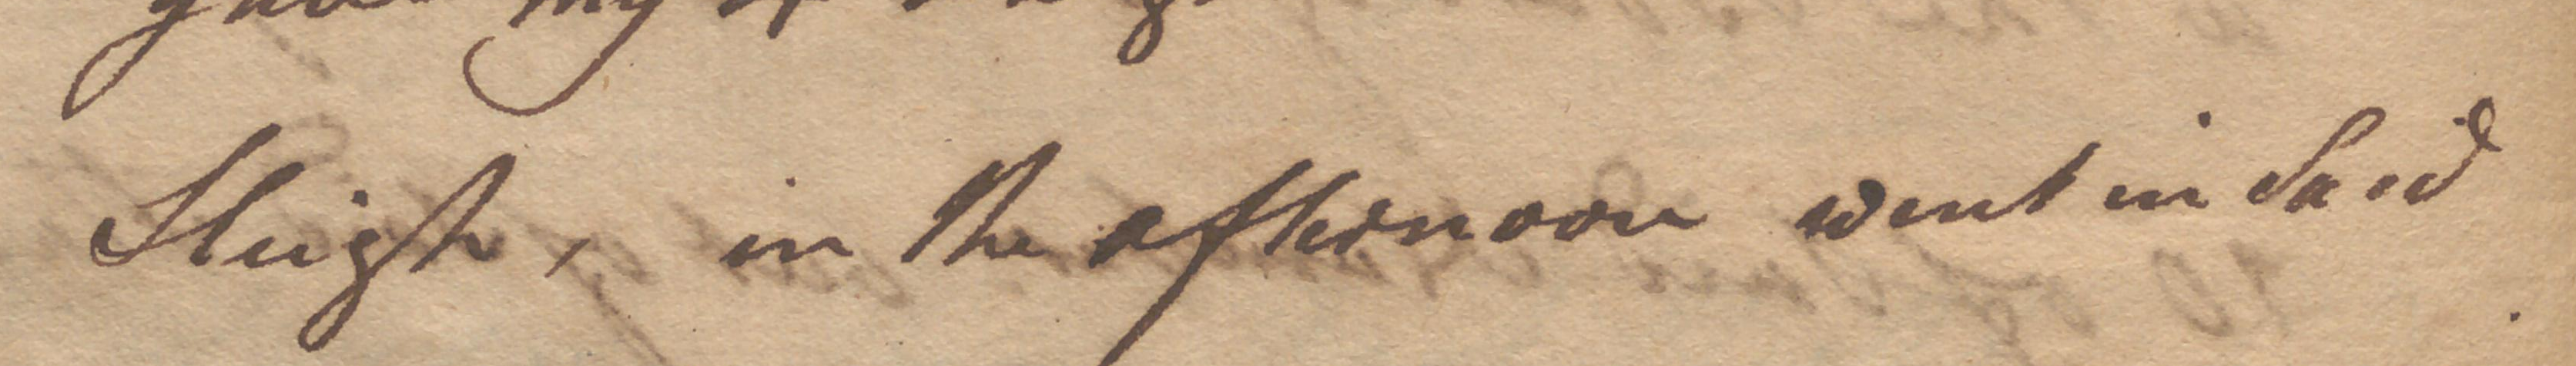Sleigh, in the afternoon went in said
